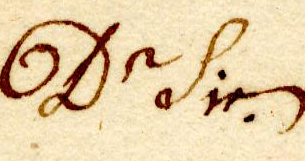D^r Sir,
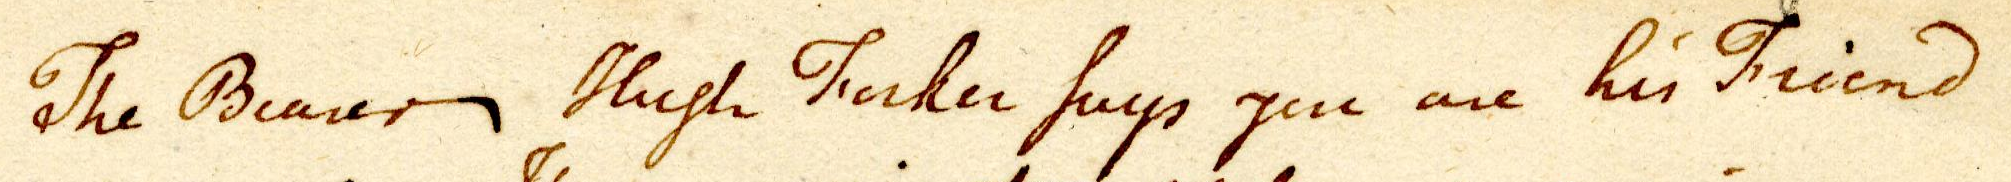The Bearer Hugh Ferker says you are his Friend
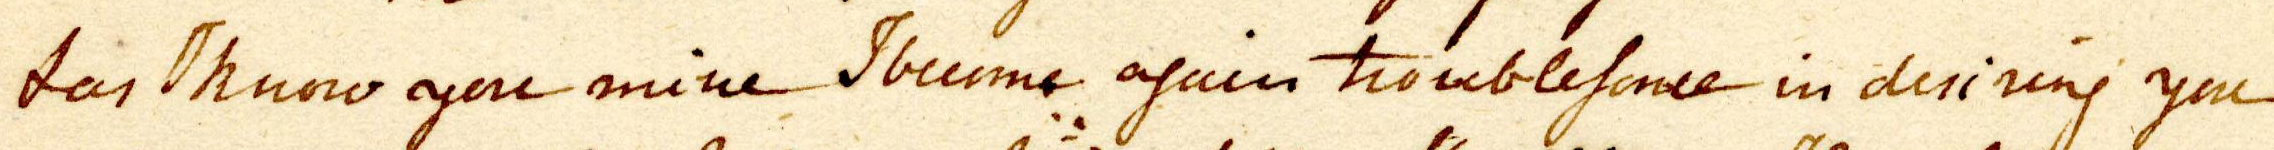& as I know you mine I became again troublesome in desiring you
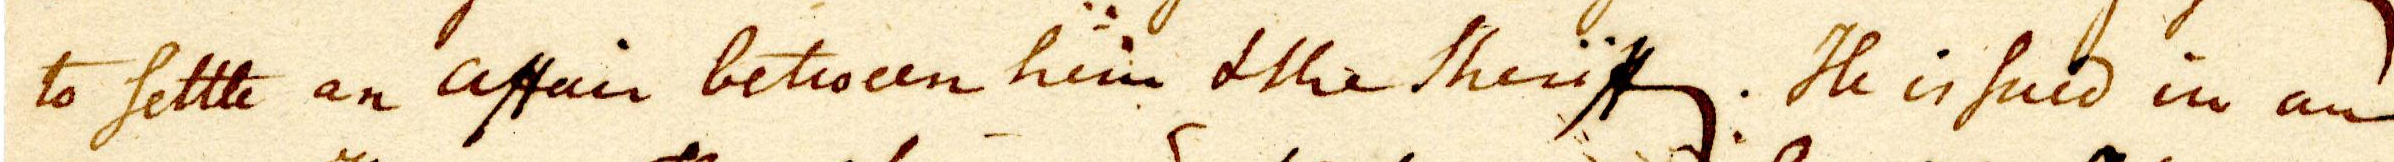to settle an affair between him & the Sheriff. He is sued in an
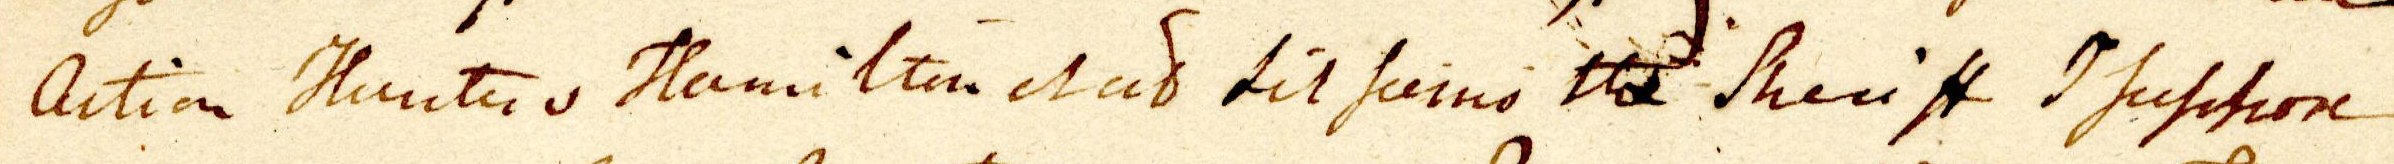Action Hunter Hamilton at ad & it sems the Sheriff I suppose
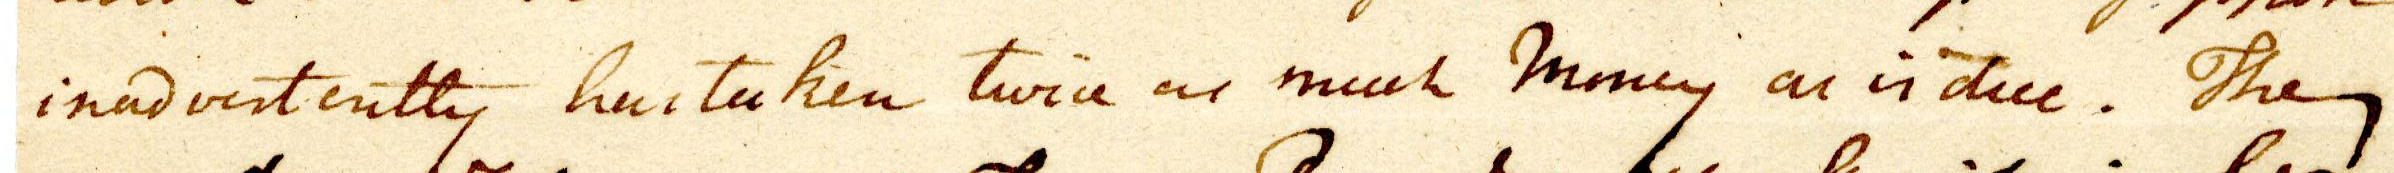inadvertently has taken twice as much money as is due. The
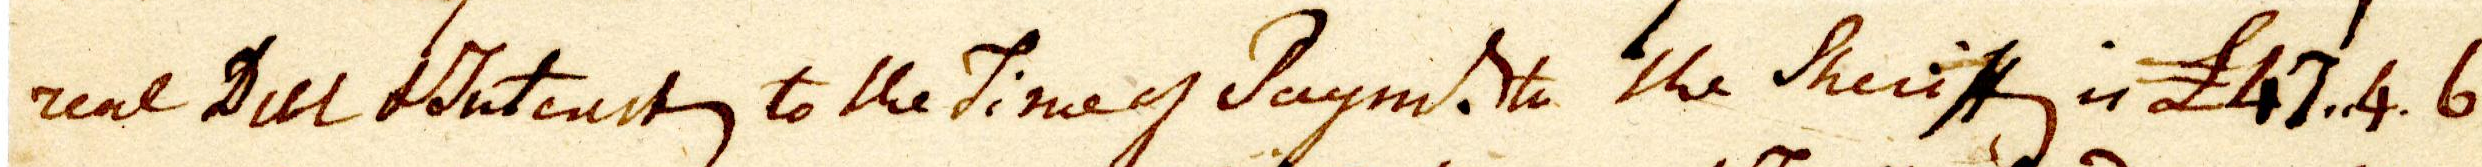real Deal & Tutenest to the Time of Paym^t. to the Sheriff is £47.4.6
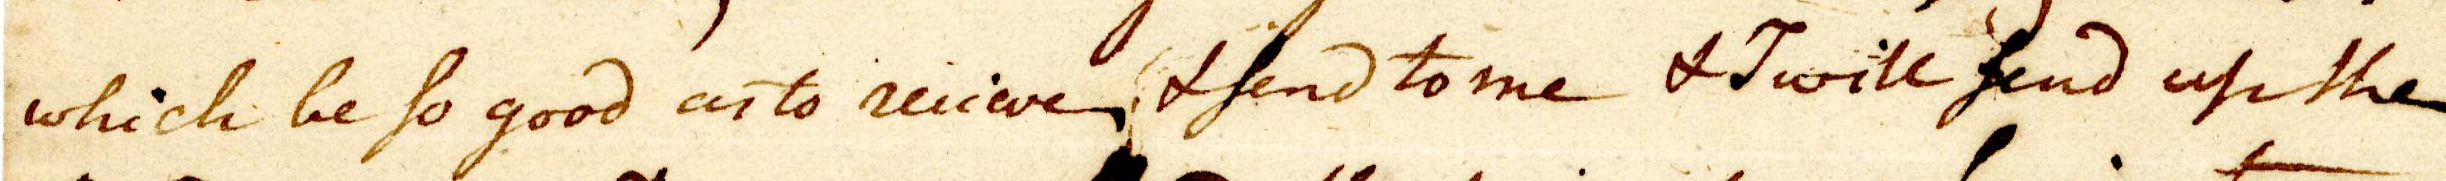which be so good as to receive & send to me & I will send up the
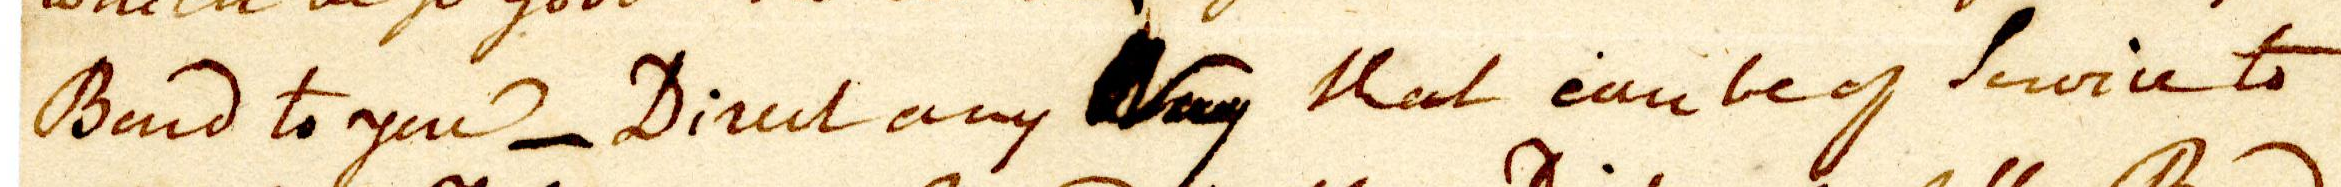Bond to you. Direct any [___] that can be of Service to
